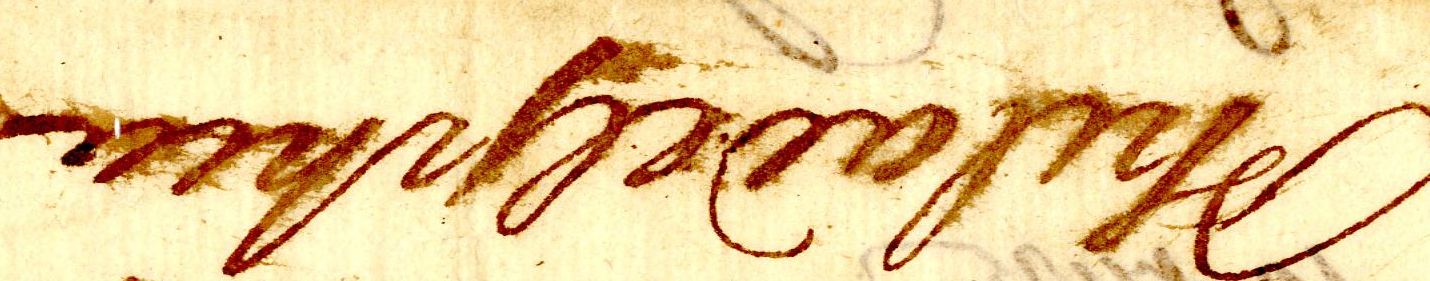Philadelphia
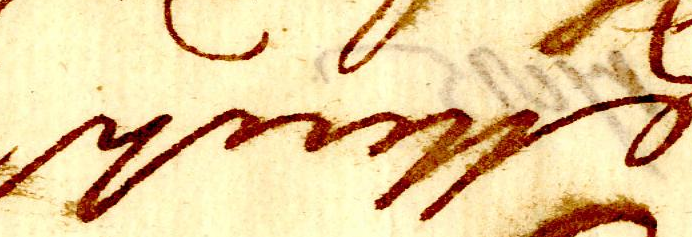Merch^t
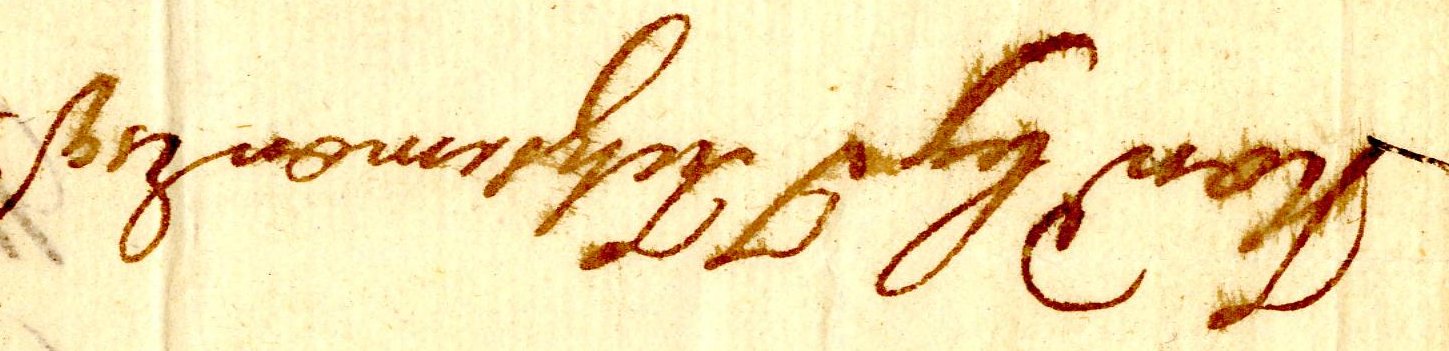Hon^d by J Tehsemons Esq^r
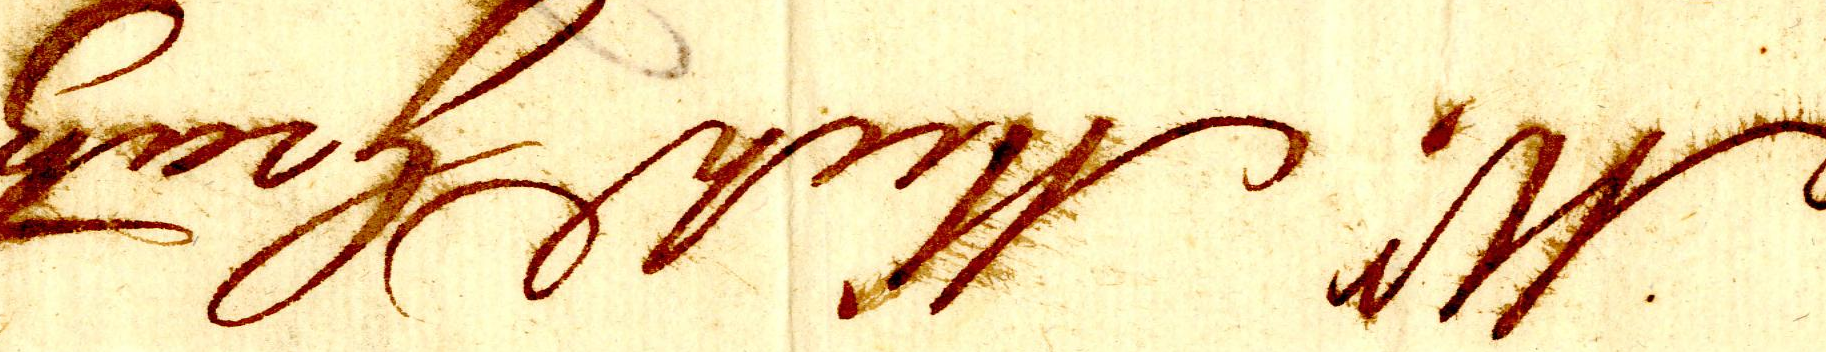M^r Mich^l Gratz
